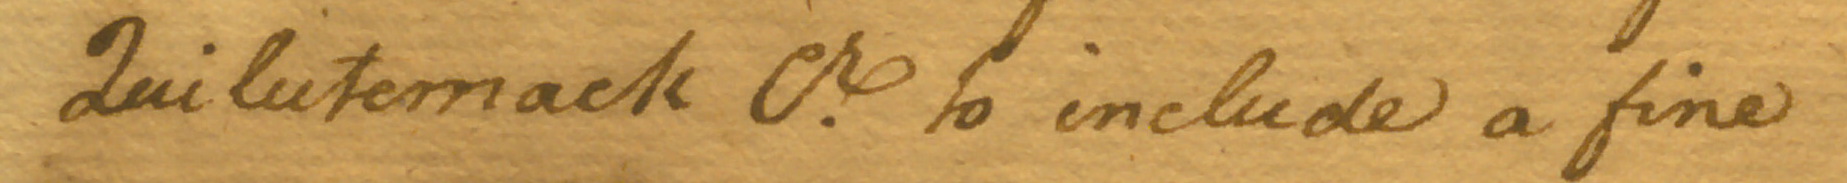Quilutemack C^r. to include a fine
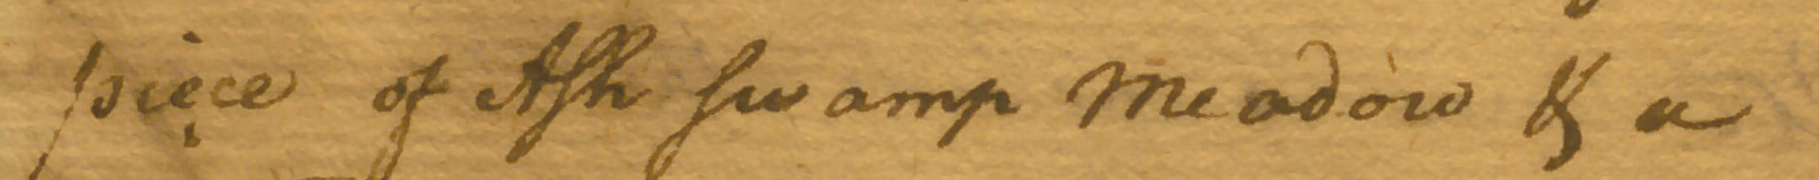piece of Ash swamp meadow & a
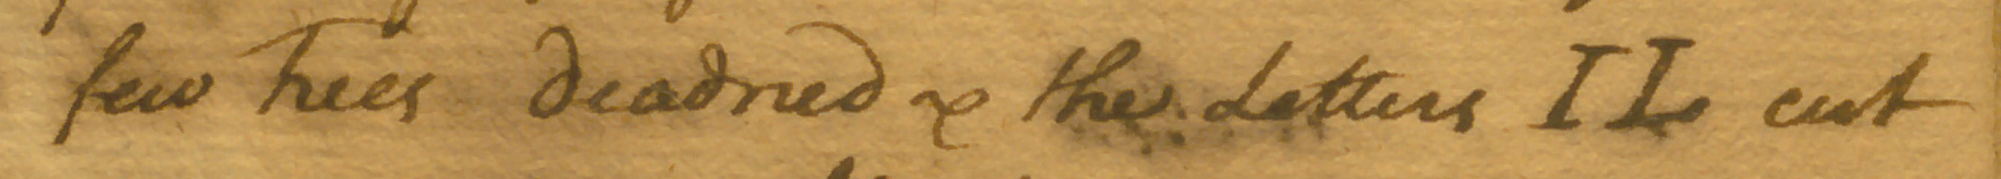few Trees deadned & the Letters IL cut
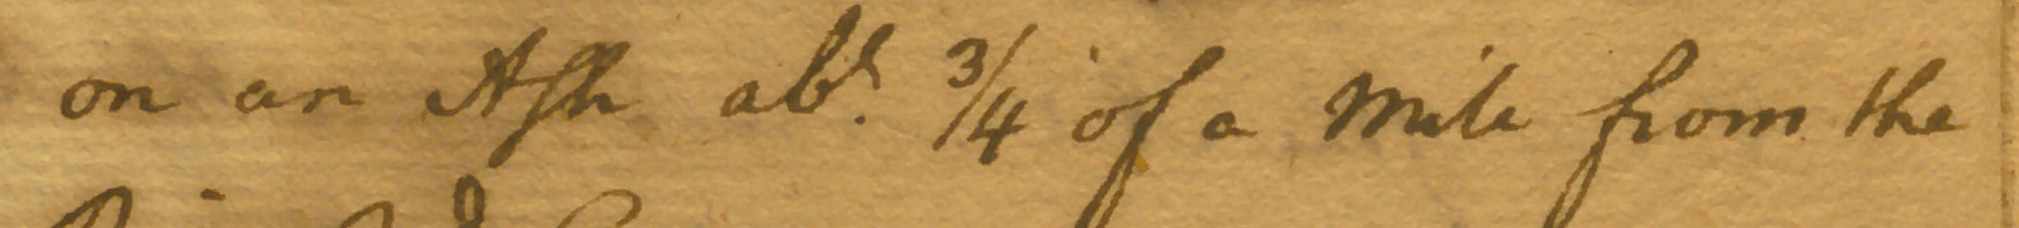on an Ash ab^t. 3/4 of a mile from the
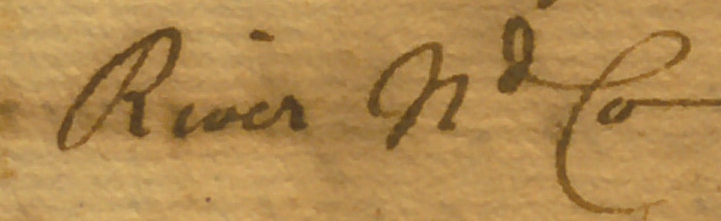River N^d C^o
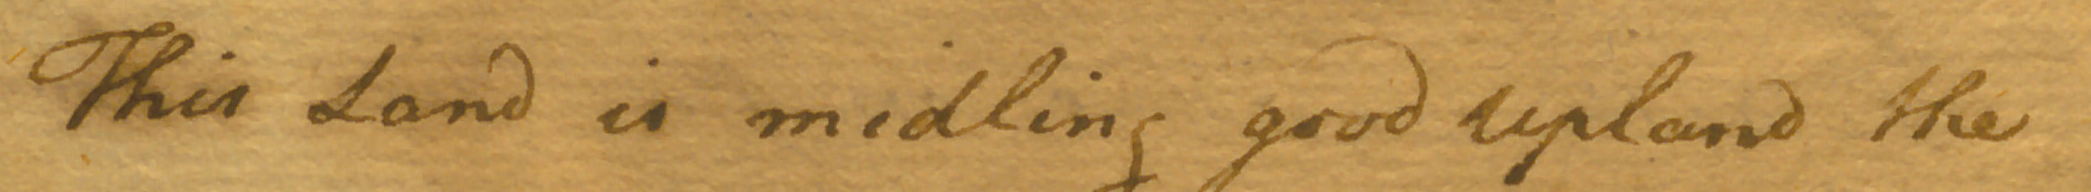This Land is midling good upland the
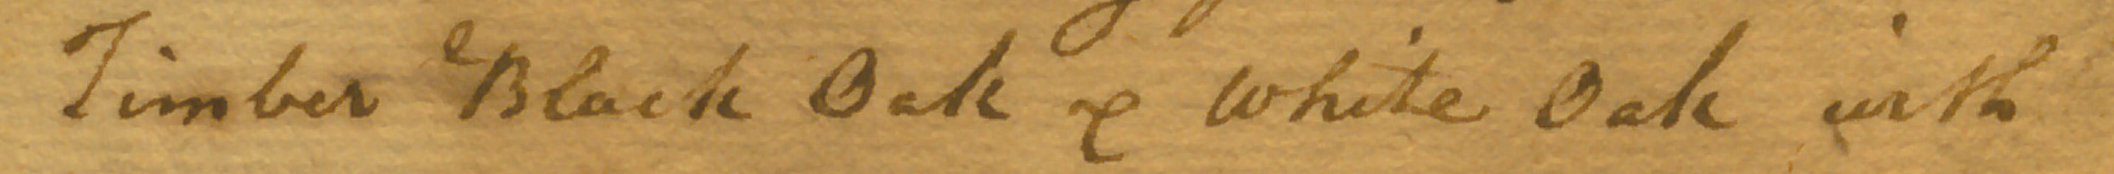Timber Black Oak & White Oak with
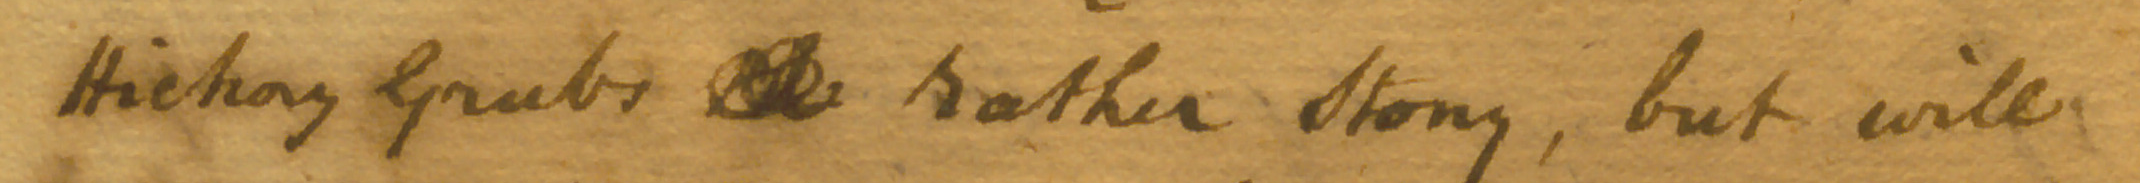Hickory Grubs rather stony, but will
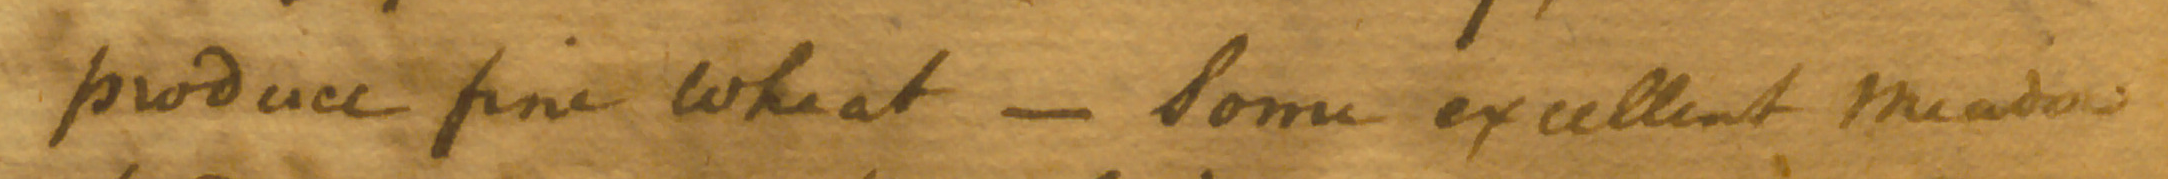produce fine wheat- Some excellent meadow
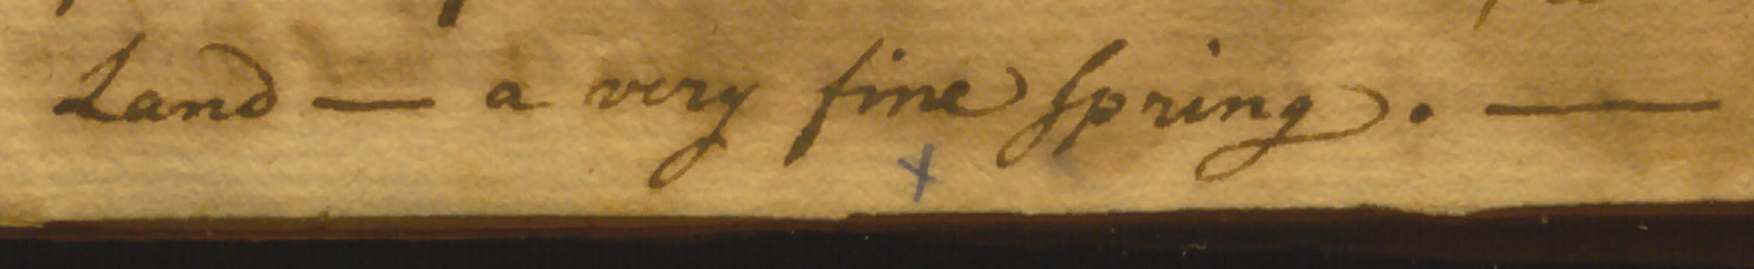Land- a very fine spring.-
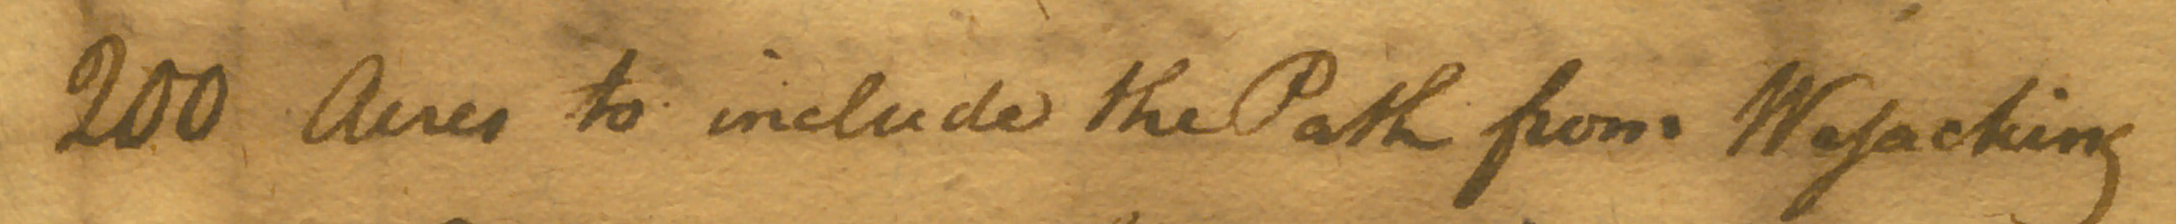200 acres to include the Path from Wesacking
